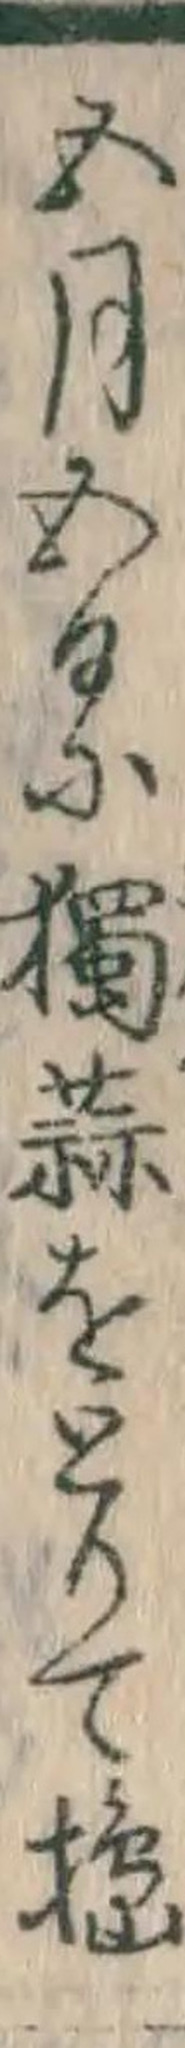五月五日に独蒜をとりて搗
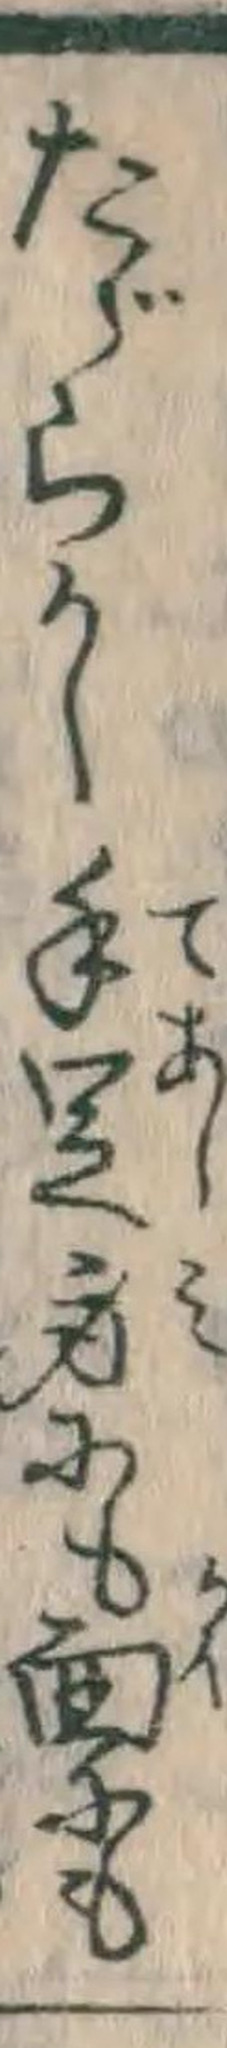たゞらかし手足身にも面にも
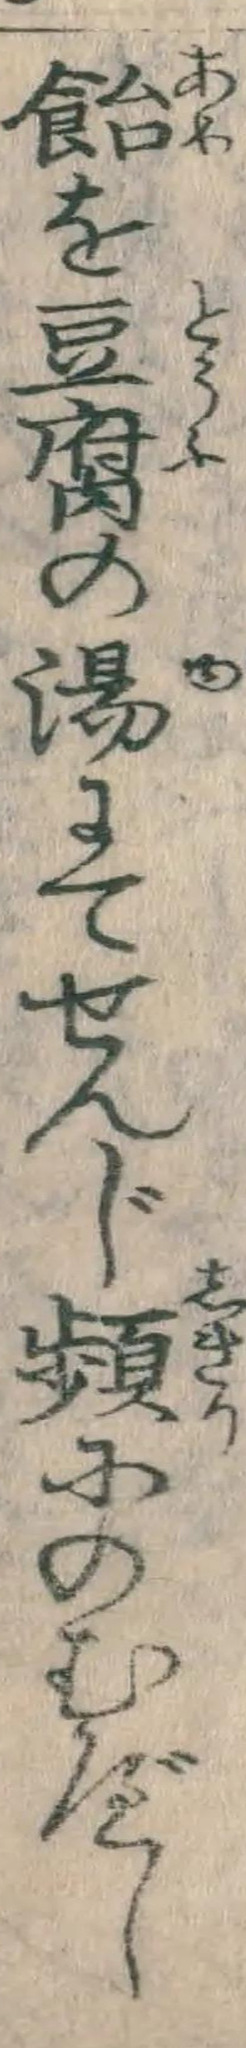飴を豆腐の湯にてせんじ頻にのむべし
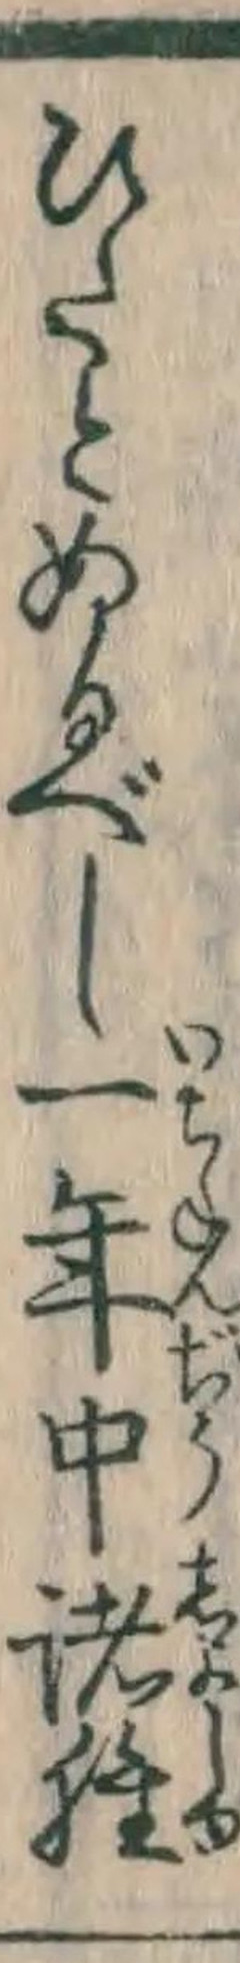ひたとぬるべし一年中諸種
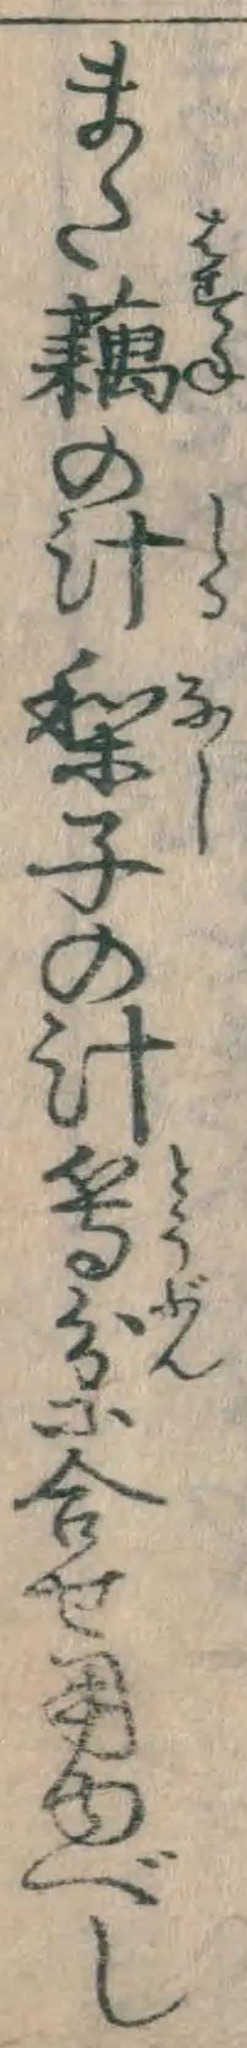また藕の汁梨子の汁等分に合せ用ゆべし

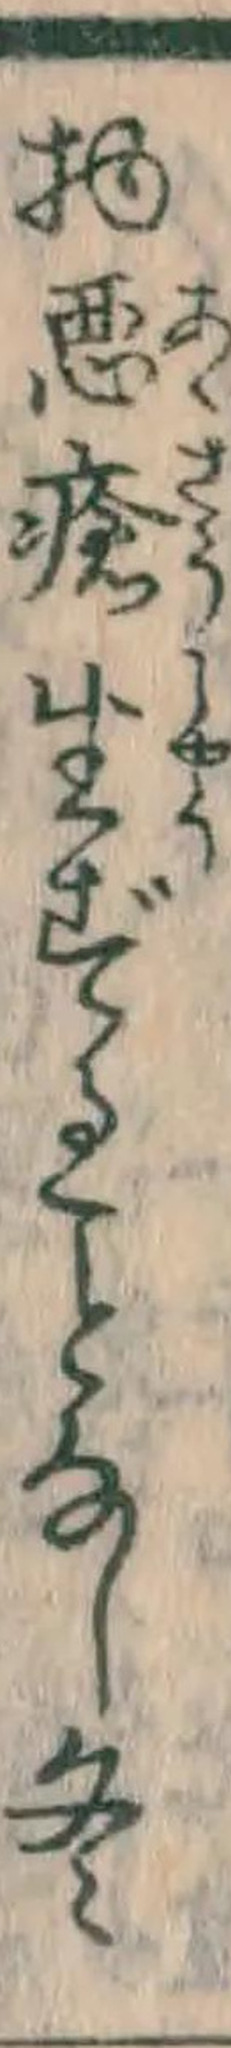物悪瘡生ずることなし冬
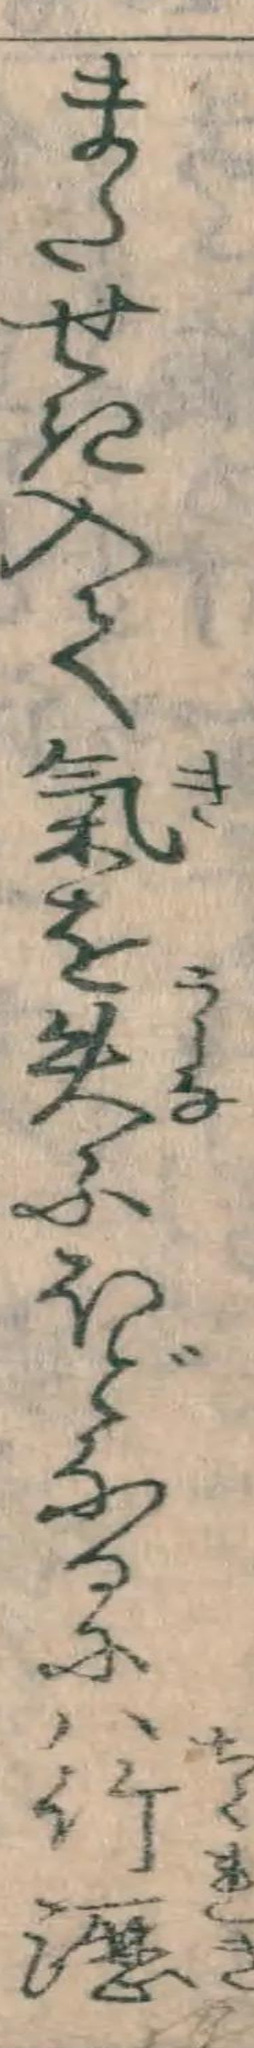またせき入て気を失ふほどなるには竹瀝
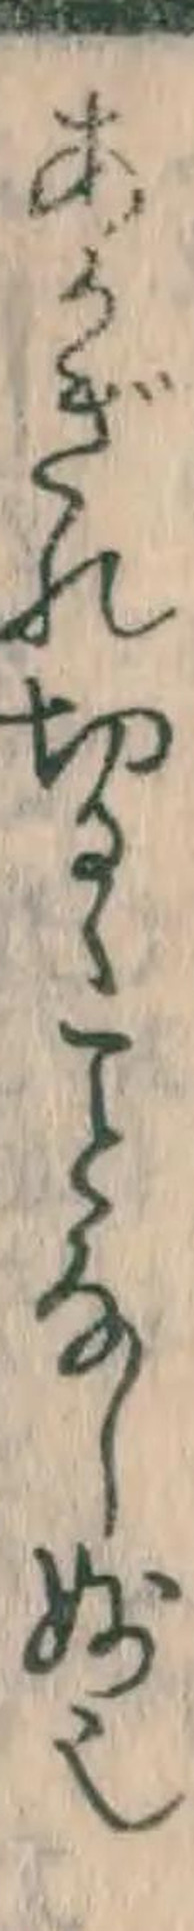あかぎれ切るゝことなし妙也
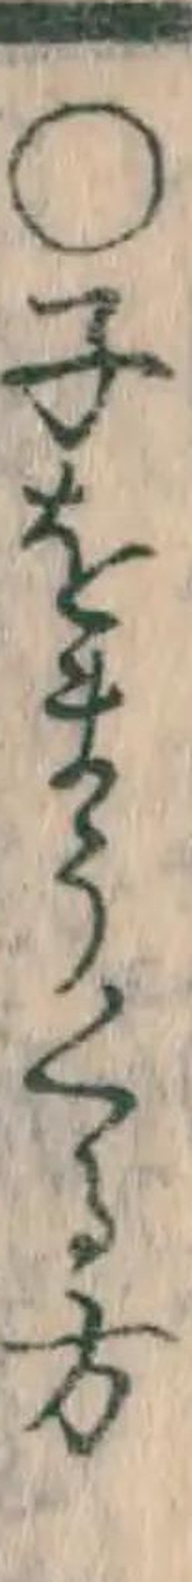○子をまうくる方
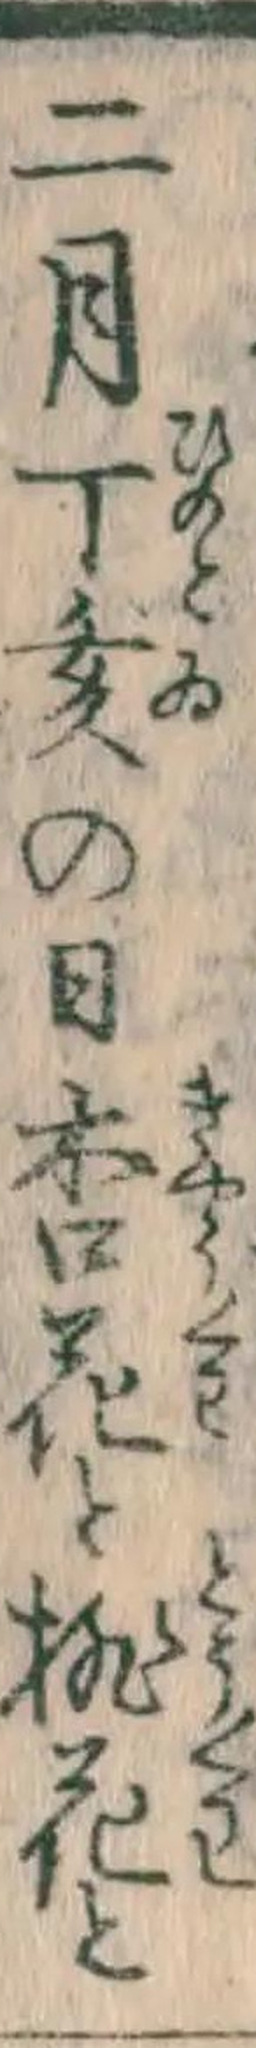二月丁亥の日杏花と桃花と
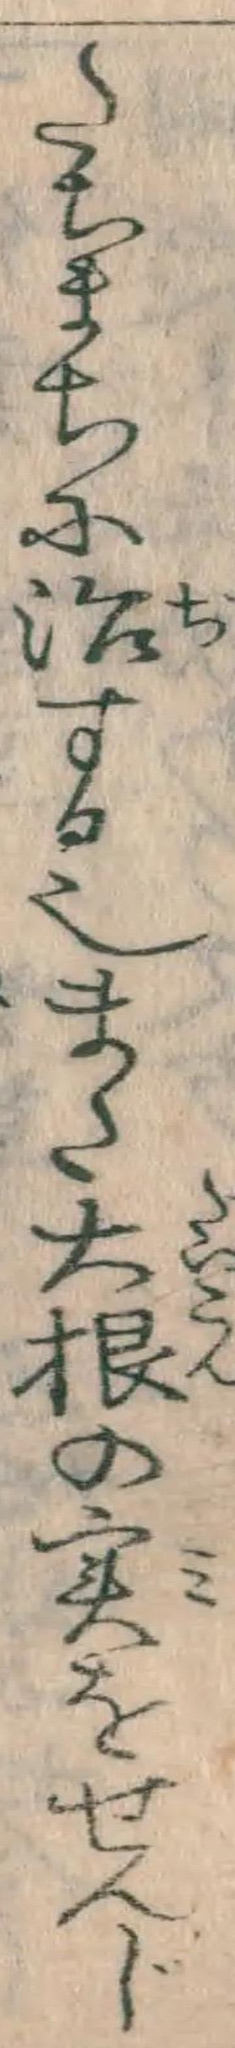たちまちに治する也また大根の実をせんじ
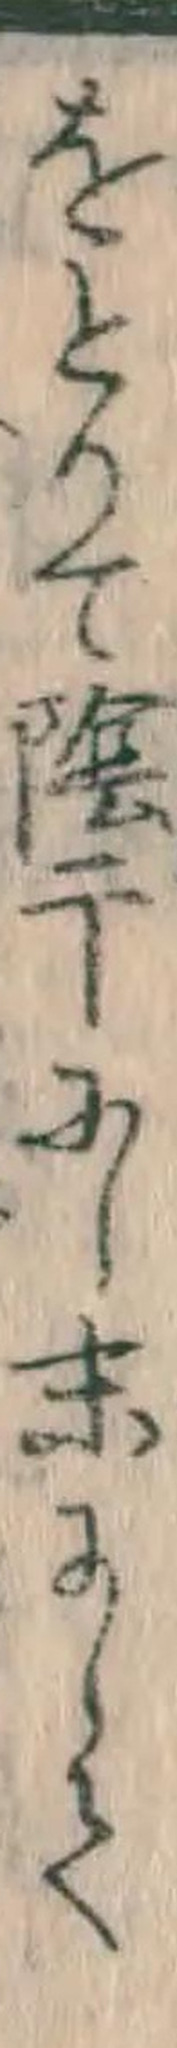をとりて陰干にし末にして
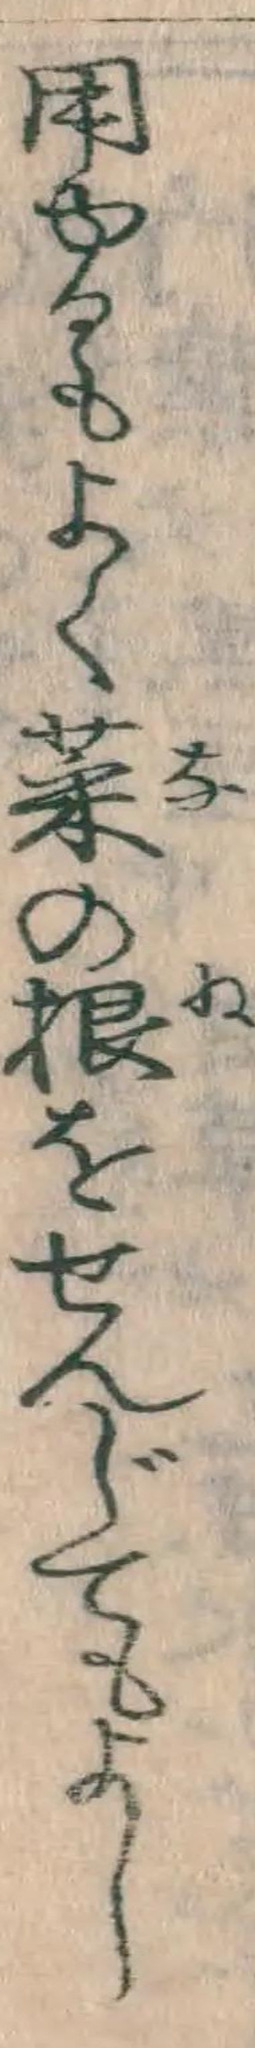用ゆるもよく菜の根をせんじてもよし
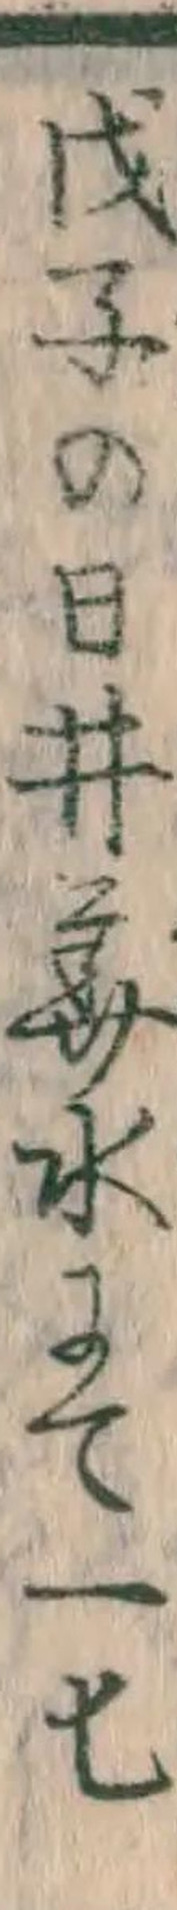戊子の日井美水にて一匕
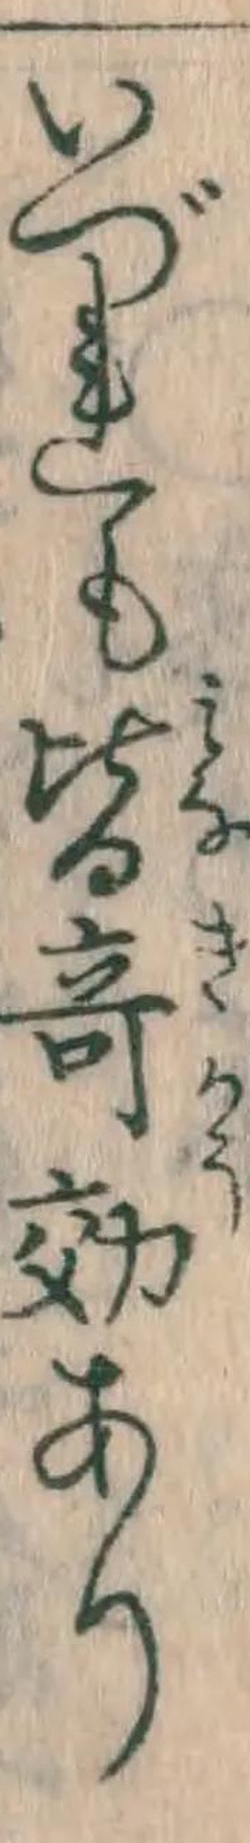いづれも皆奇効あり
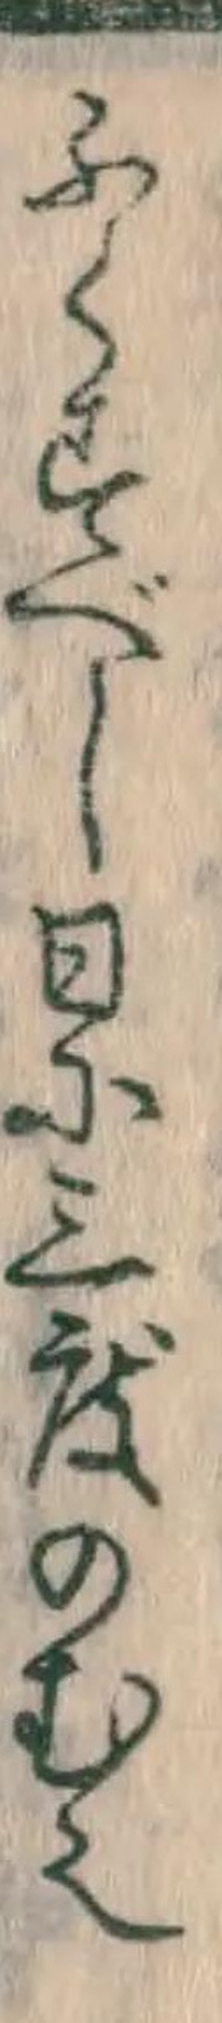ふくすべし日に三度のむ也
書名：広益秘事大全 3巻. [4]
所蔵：国立国会図書館 National Diet Library, JAPAN
